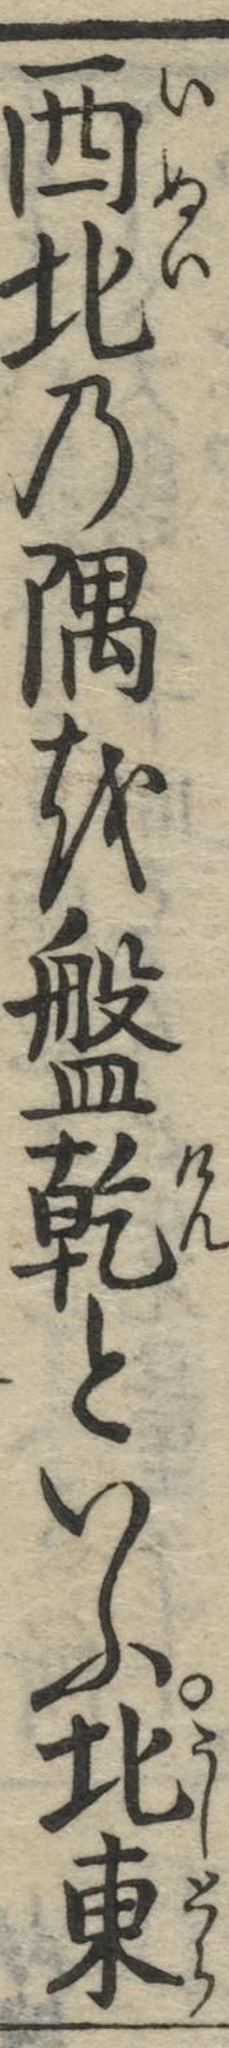西北の隅を盤乾といふ。北東
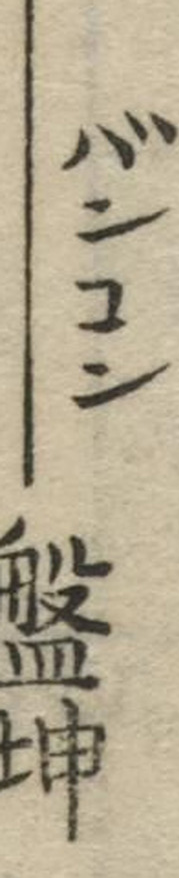バンコン盤坤
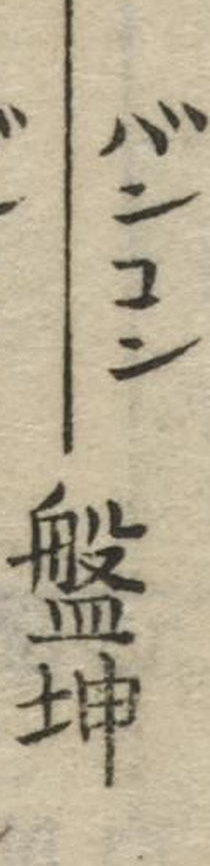バンコン盤坤
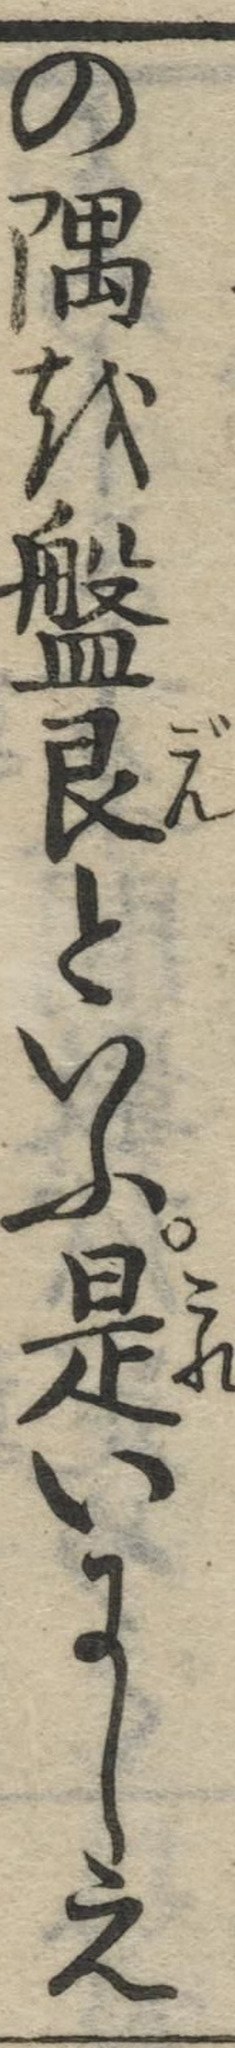の隅を盤艮といふ。是いにしえ
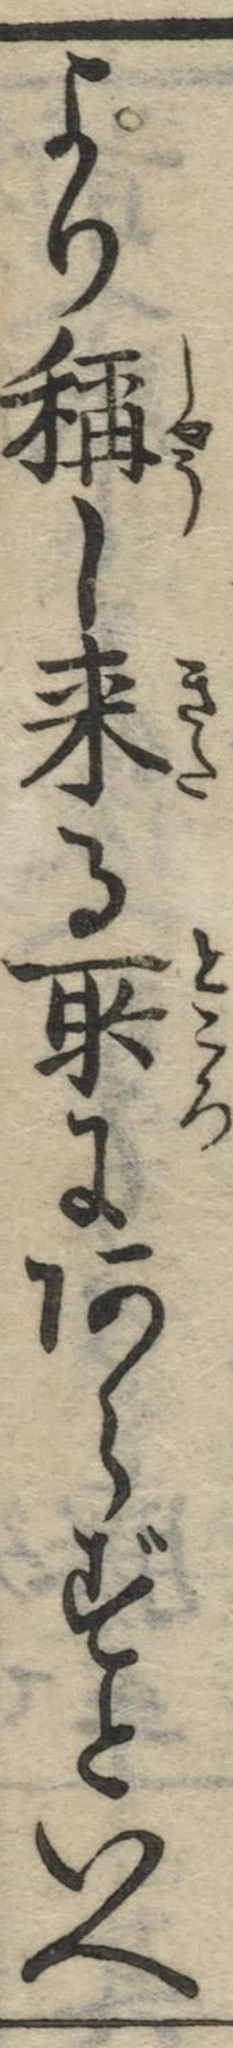より称し来る所にあらずといへ
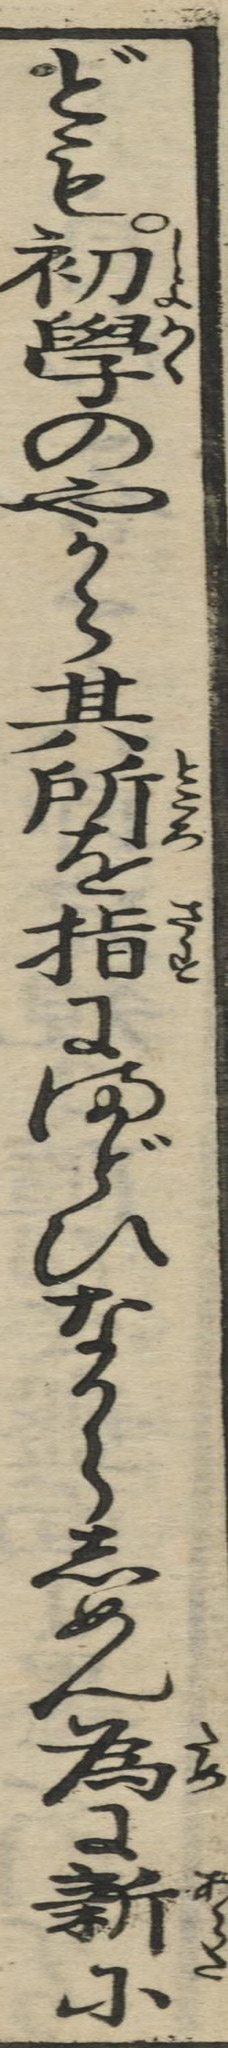ども。初学のやから其所を指にまどひなからしめん為に新に
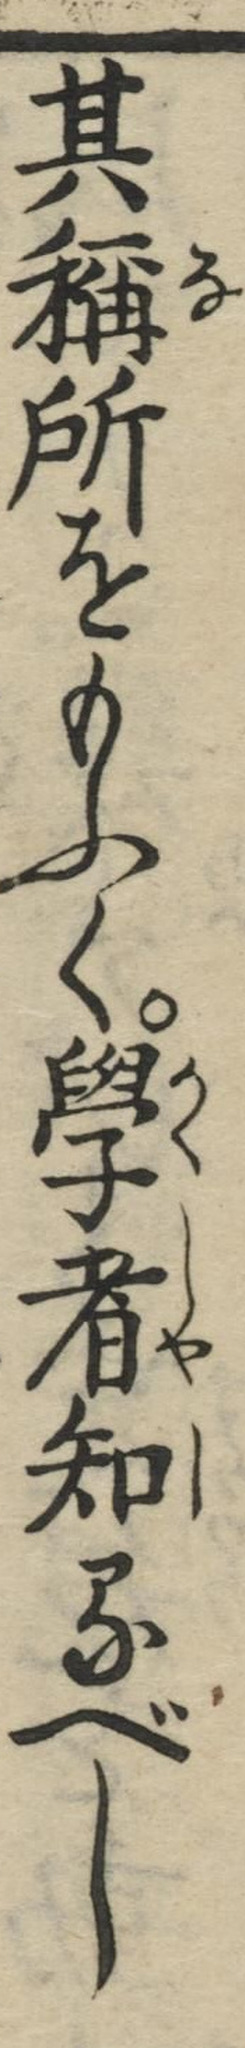其称所をもふく。学者知るべし
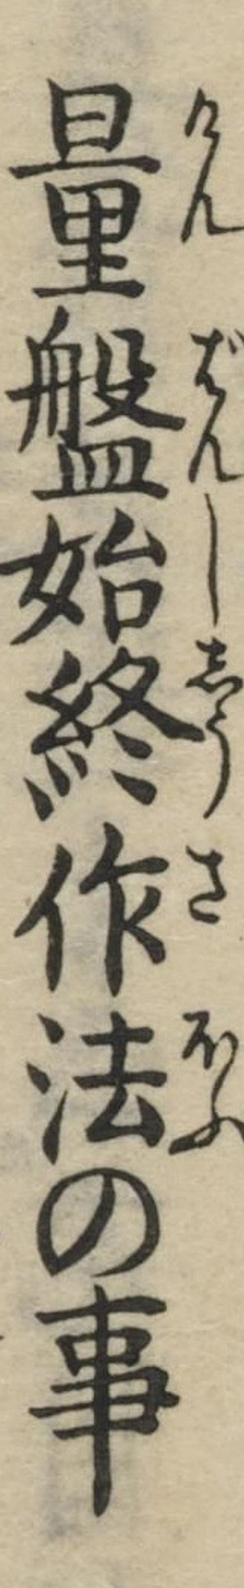量盤始終作法の事
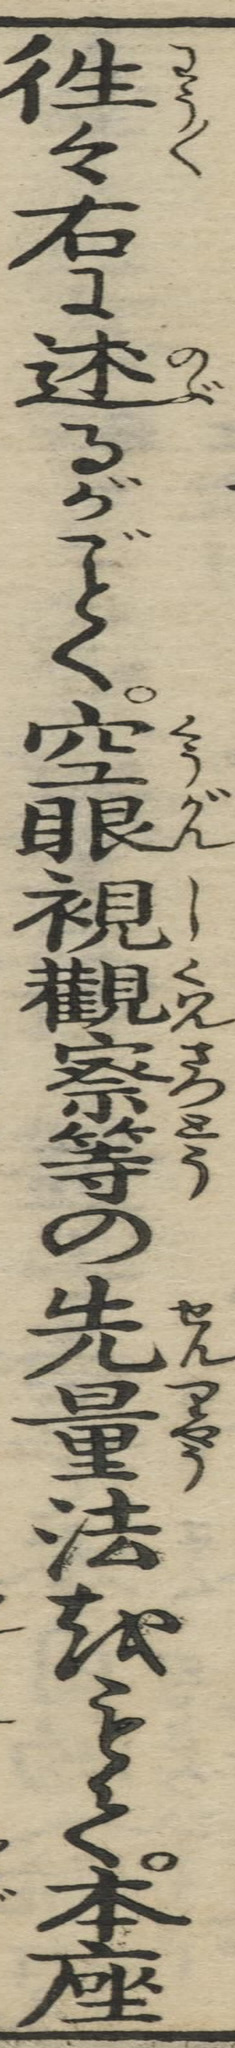往々右に述るがごとく。空眼視観察等の先量法をもて。本座
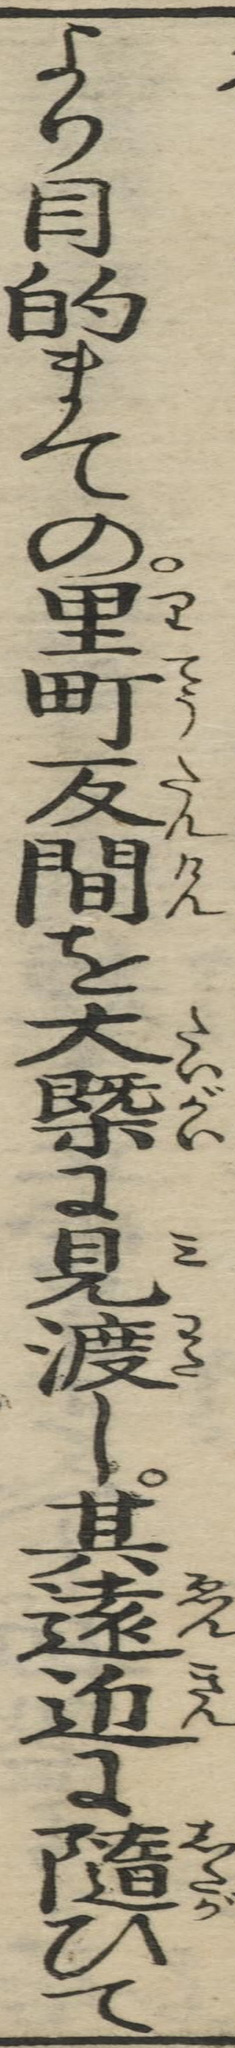より目的まての。里町反間を大概に見渡し。其遠近に随ひて
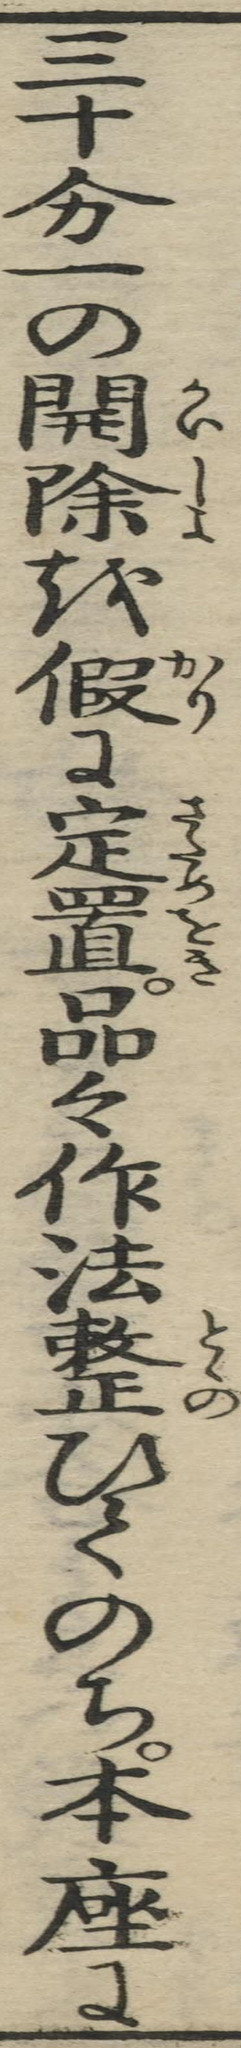三十分一の開除を仮に定置。品々作法整ひてのち。本座に
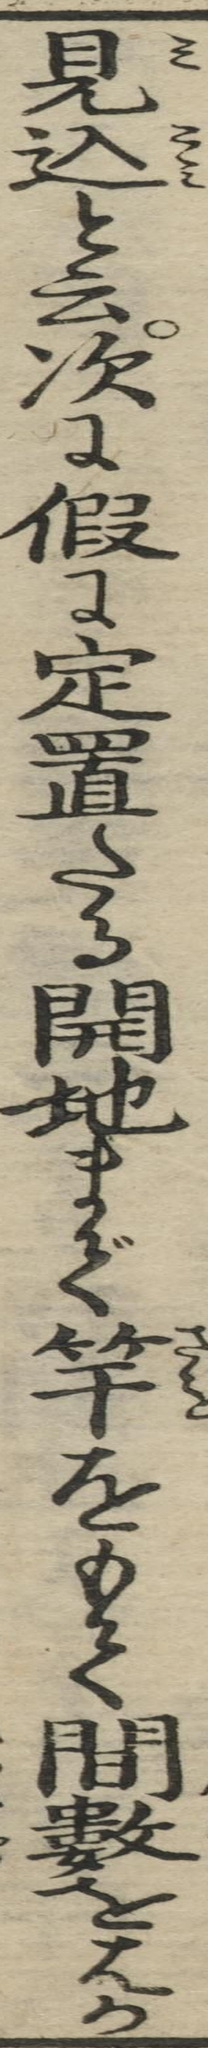見込と云。次に仮に定置たる開地まで竿をもて間数をはか

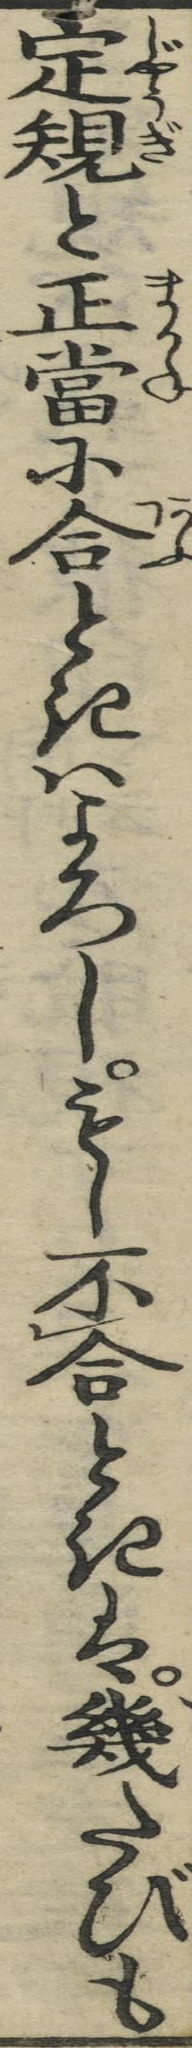定規と正当に合ときはよろし。もし不合ときは。幾たびも
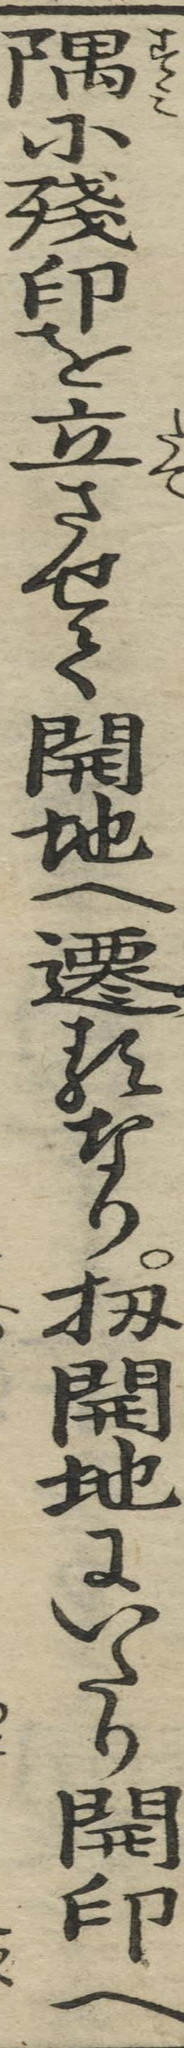隅に残印を立させて開地へ遷るなり。扨開地にいたり開印へ
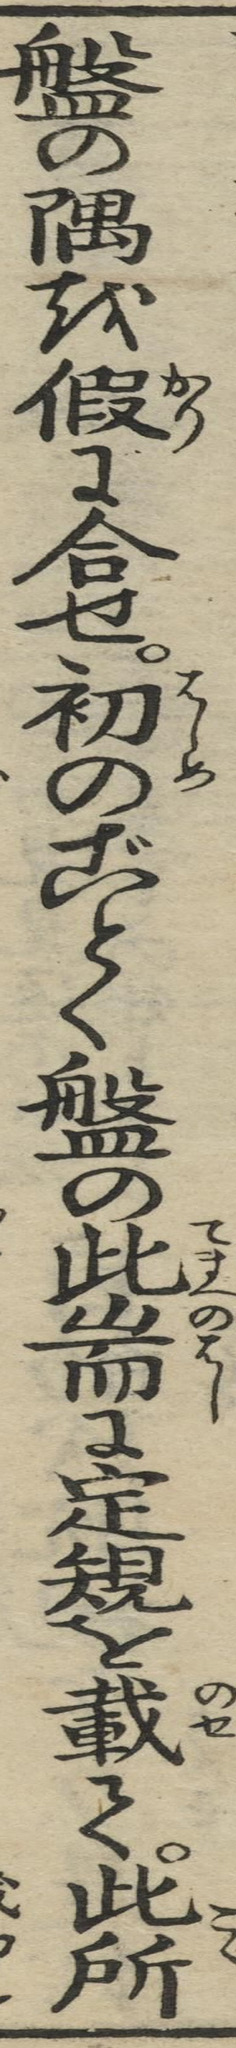盤の隅を仮に合せ。初のごとく盤の此端に定規を載て。此所
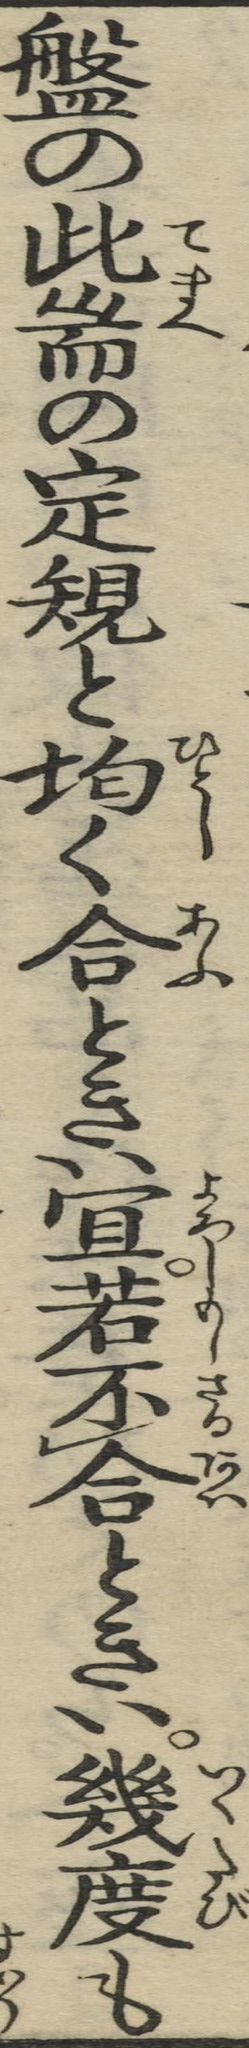盤の此端の定規と均く合ときは宜。若不合ときは。幾度も
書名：量地指南　巻之一（内題）
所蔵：東京大学地震研究所図書室 Earthquake Research Institute Library, The University of Tokyo, JAPAN
